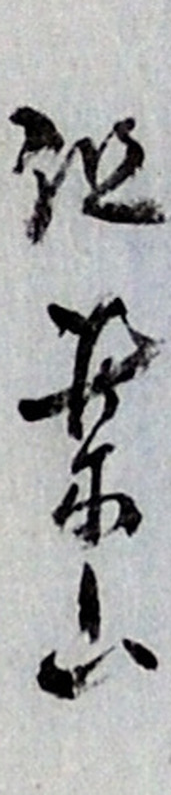但柴山
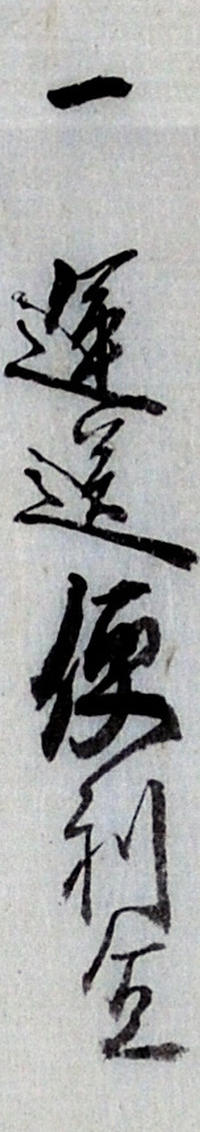一運送便利宜
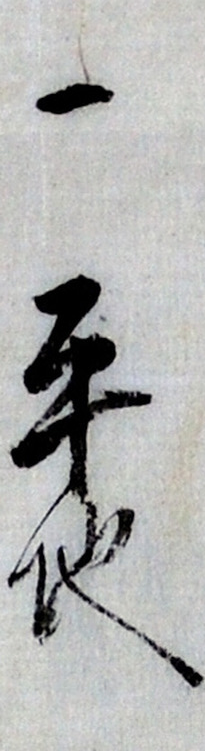一平地

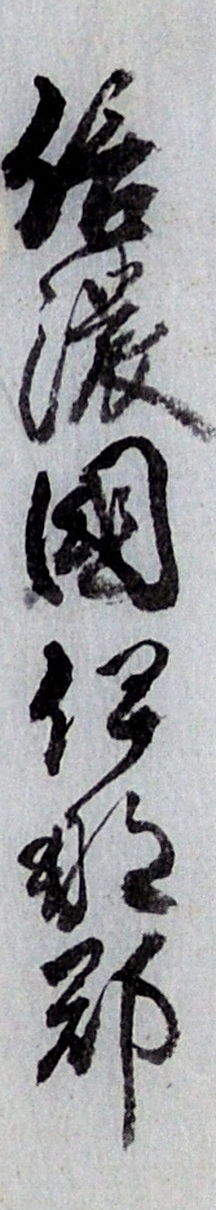信濃国伊那郡
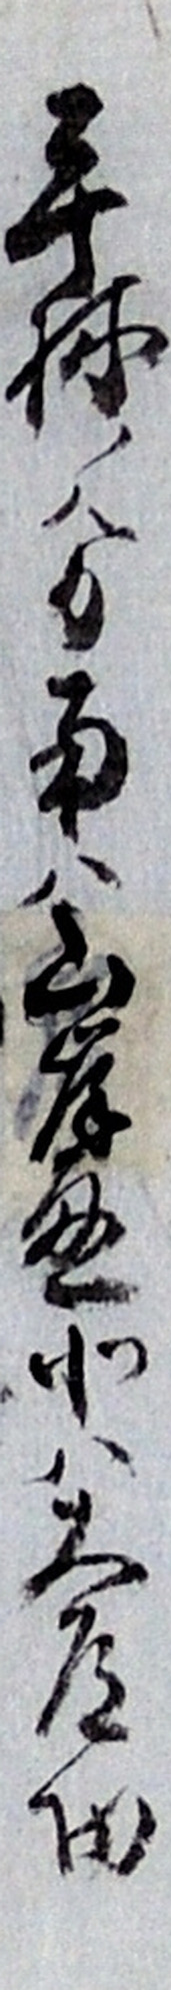平林ノ内南ハ山岸通北ハ大道◻︎
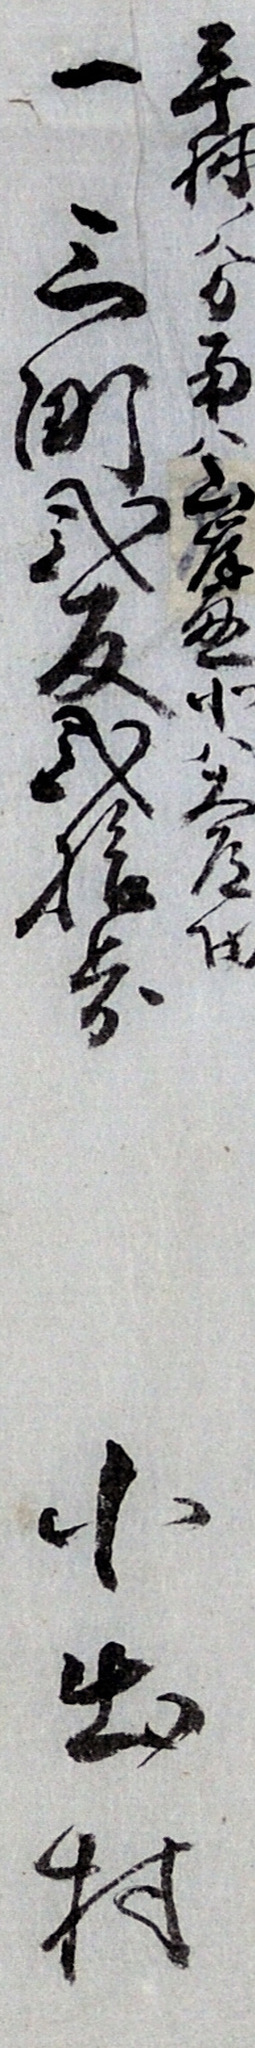一三町弐反弐拾歩小出村
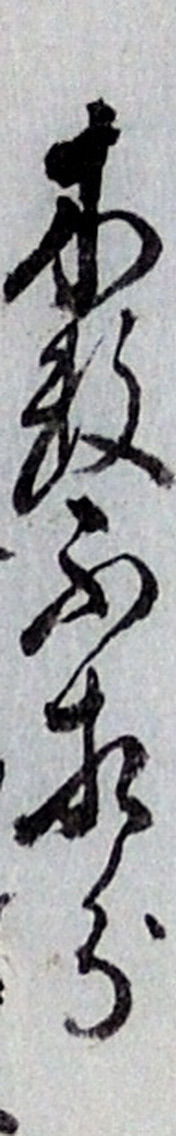木数不相分
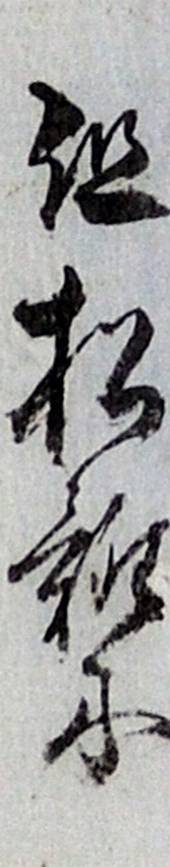但松雑木
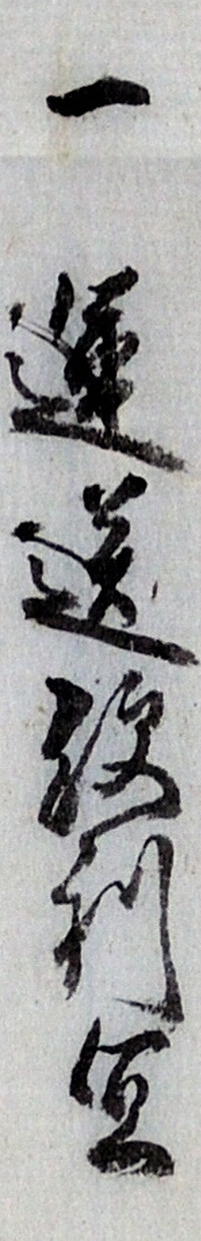一運送便利宜
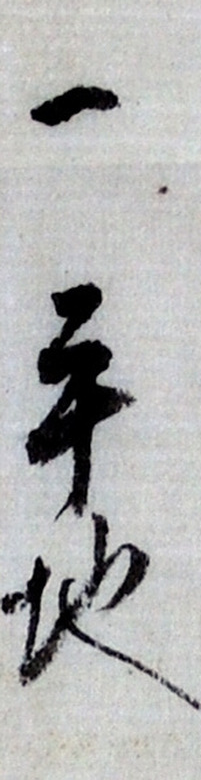一平地

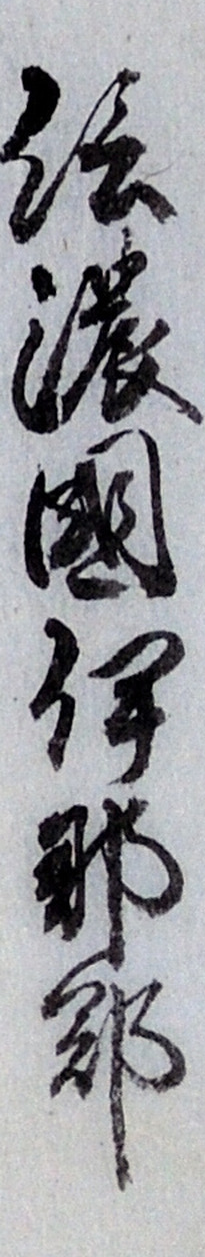信濃国伊那郡
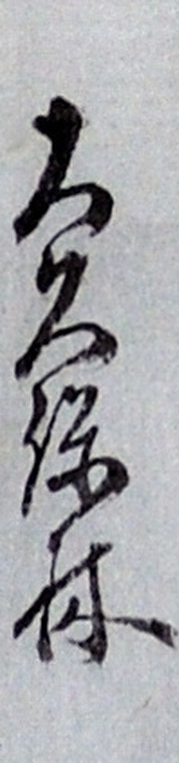大久保林
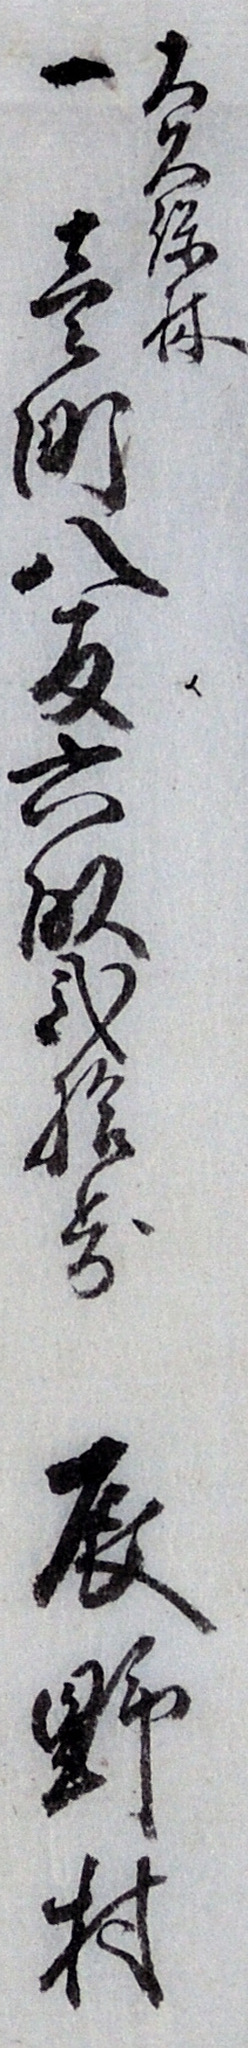一壱町八反六㽗弐拾歩辰野村
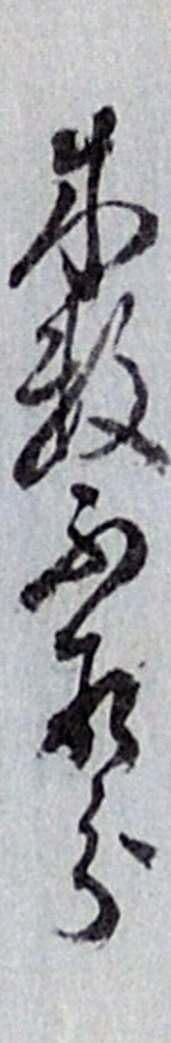木数不相分
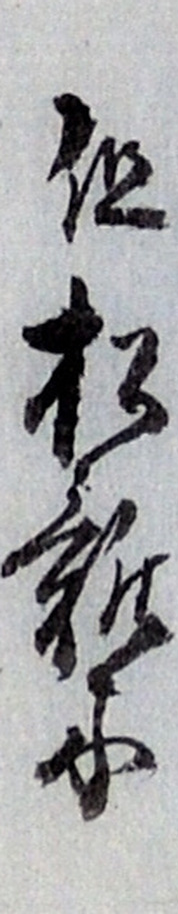但松雑木
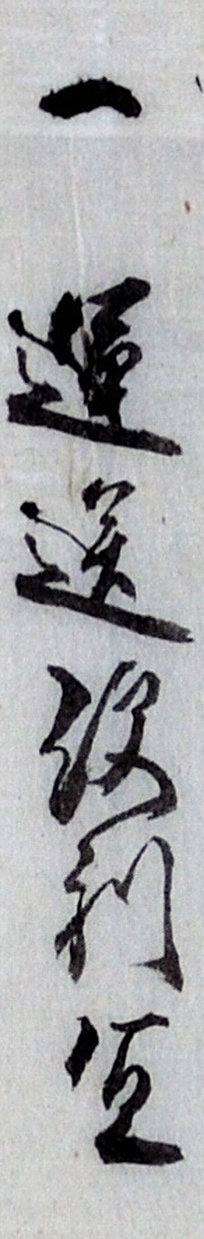一運送便利宜
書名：官林反別帳
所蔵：伊那市立高遠町図書館・合同会社AMANE
